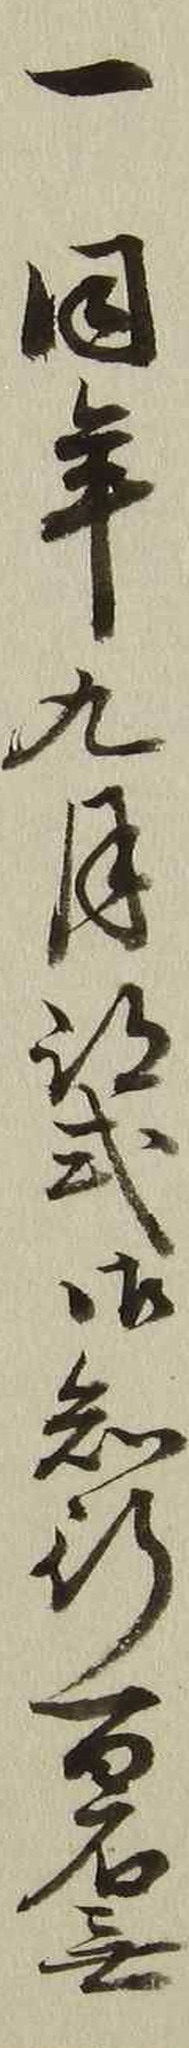一同年九月跡式御知行百石無
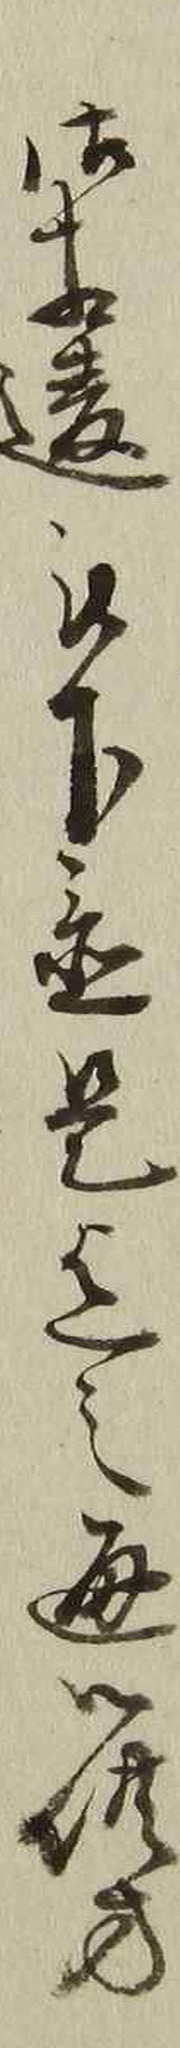御相違被下置是迄之通御供方
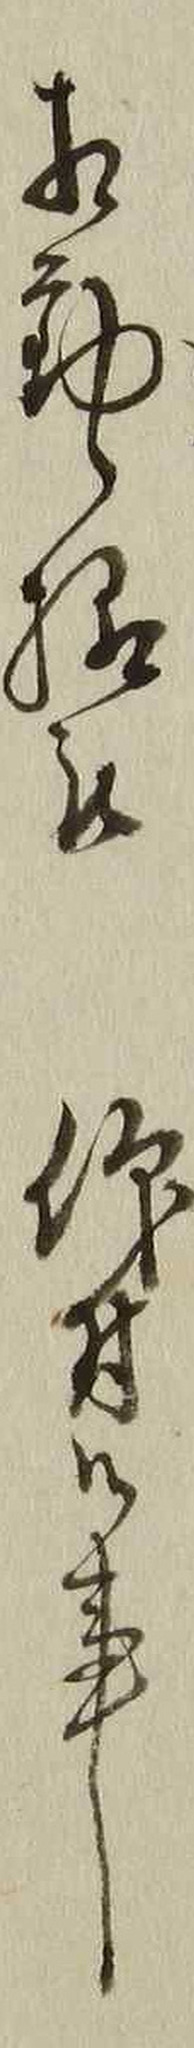相勤候様被仰付候事
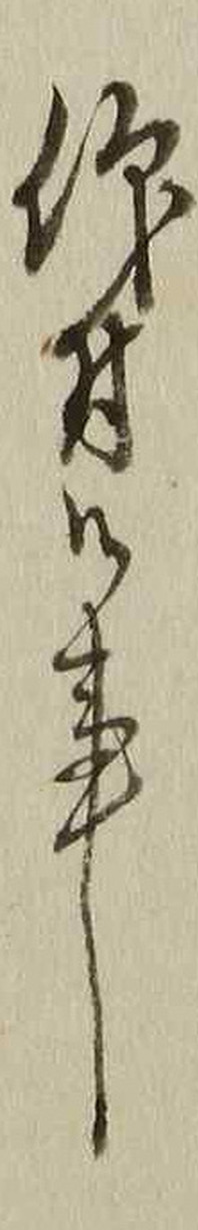仰付候事
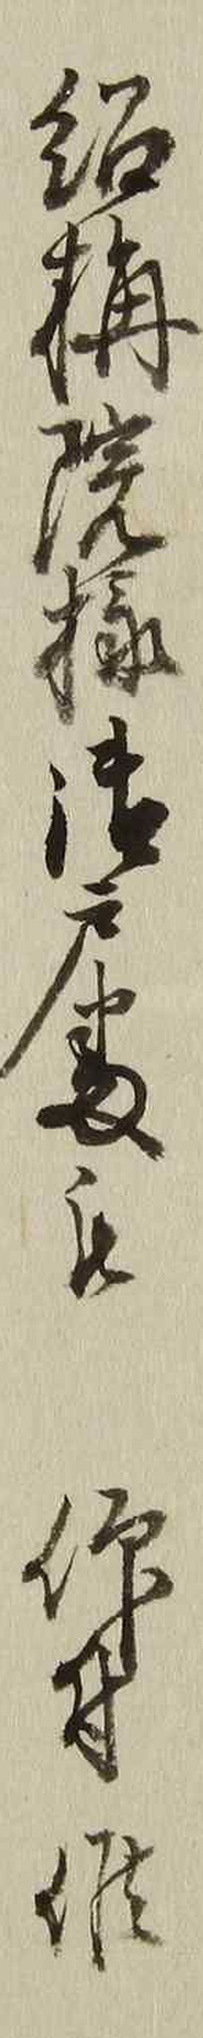紹栴院様御戸番被仰付候
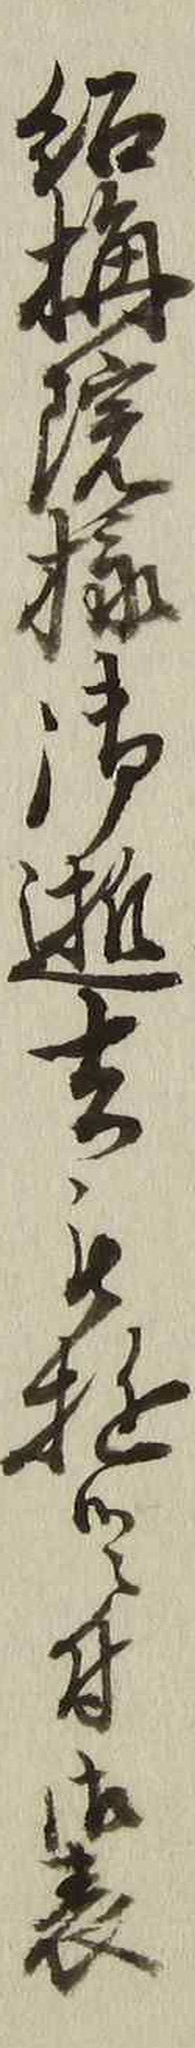紹栴院様御逝去被遊候ニ付御表
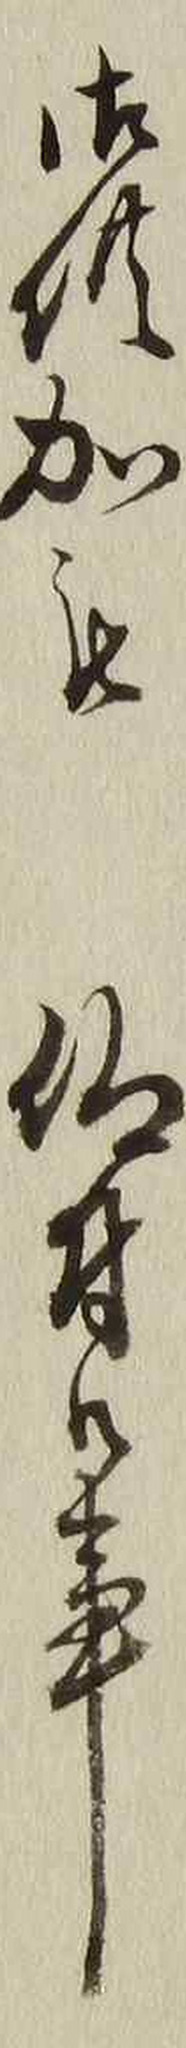御供加被仰付候事
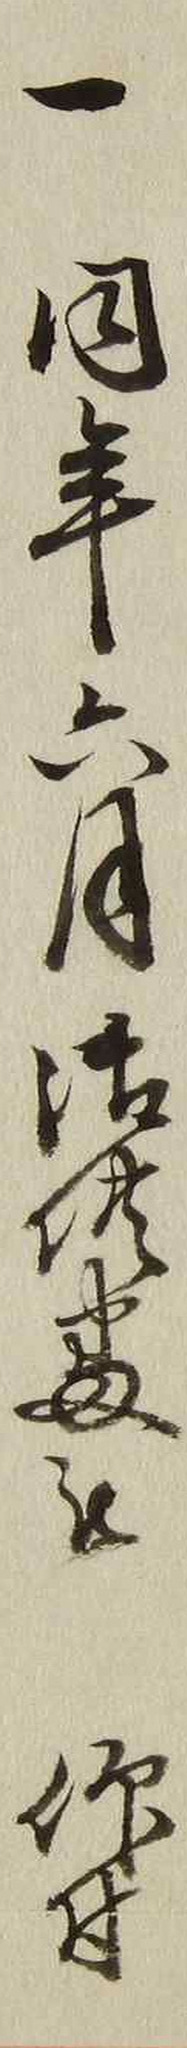一同年六月御供番被仰付
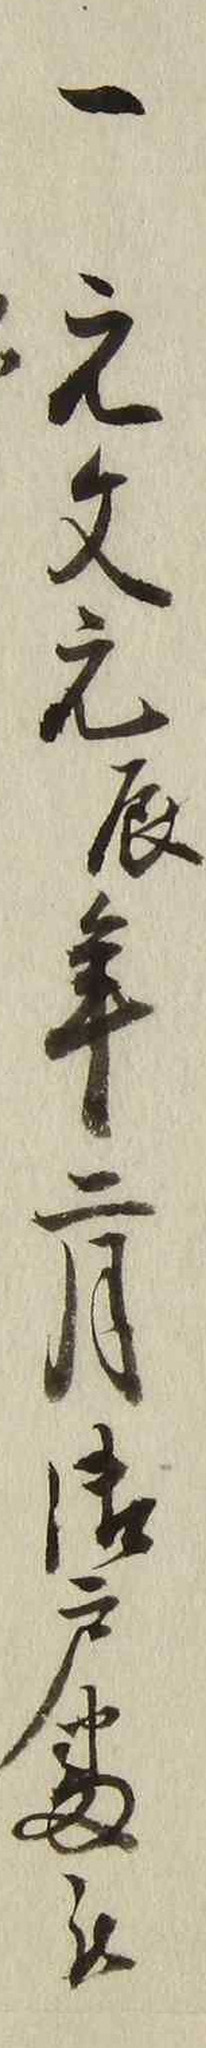一元文元辰年二月御戸番被
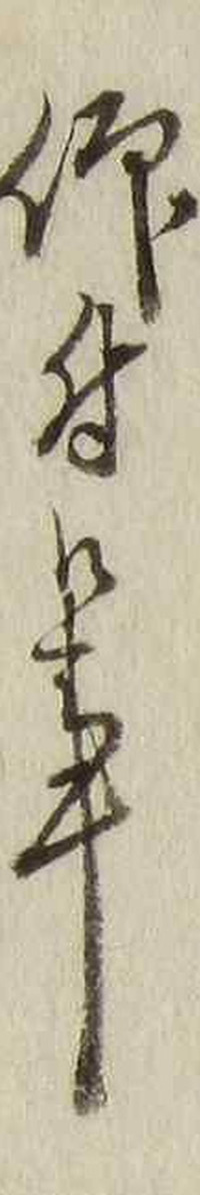仰付候事
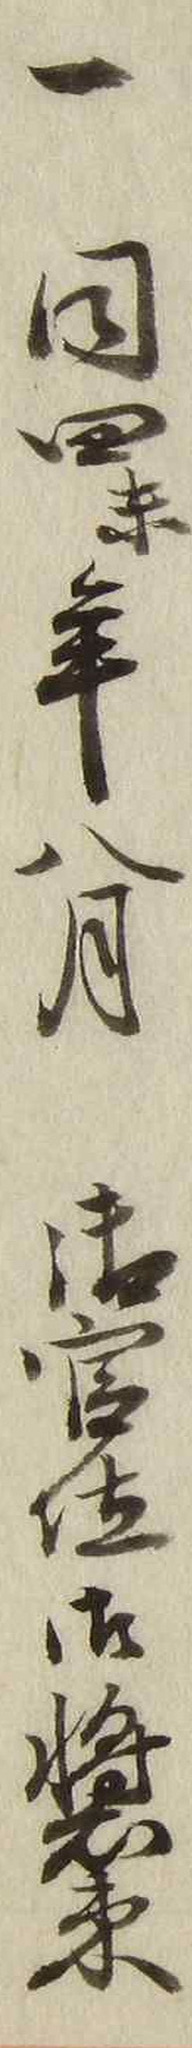一同四未年八月御官位御装束

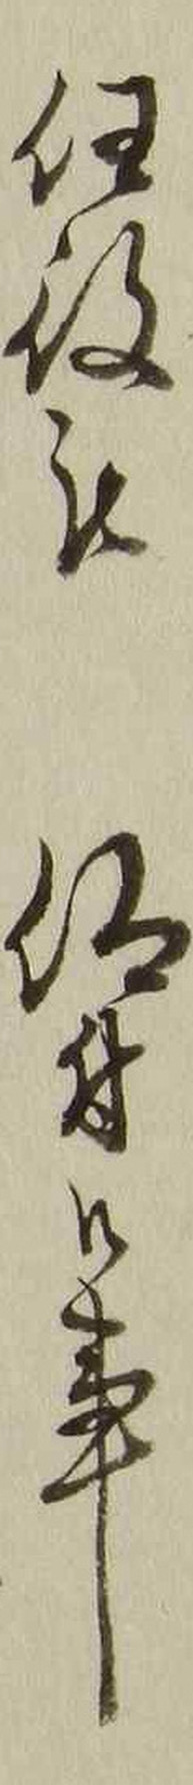任役被仰付候事
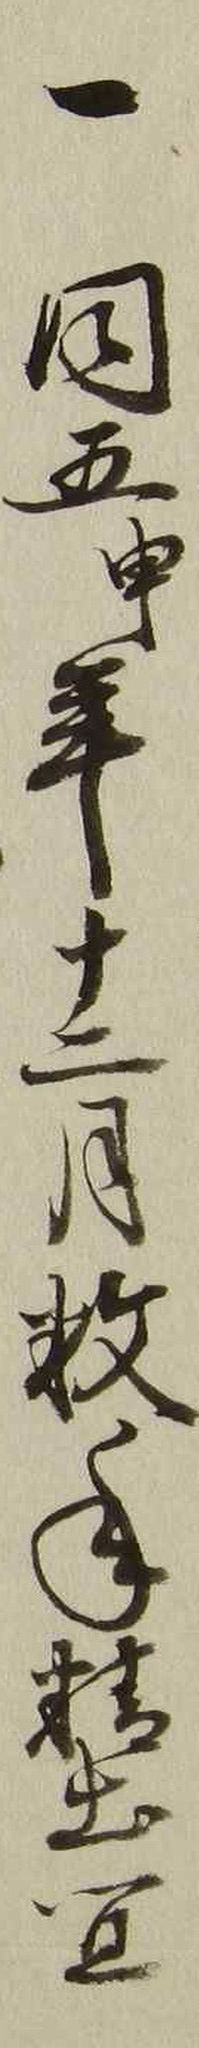一同五申年十二月数年精出宜
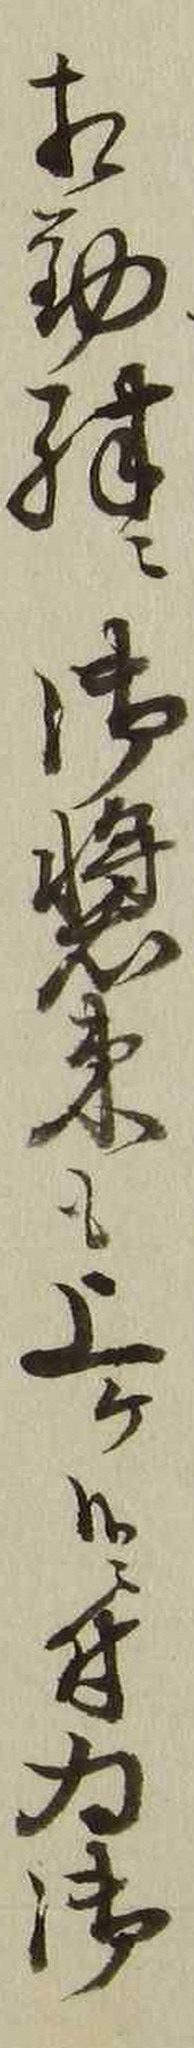相勤殊ニ御装束も上ケ候ニ付為御
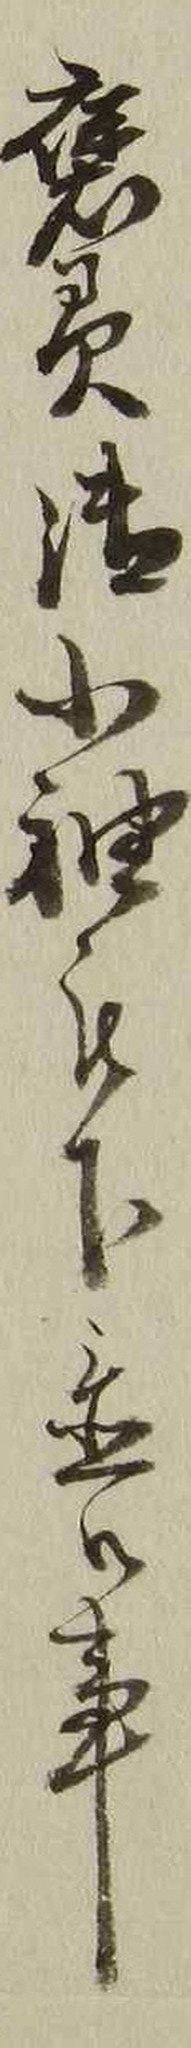褒美御小袖被下置候事
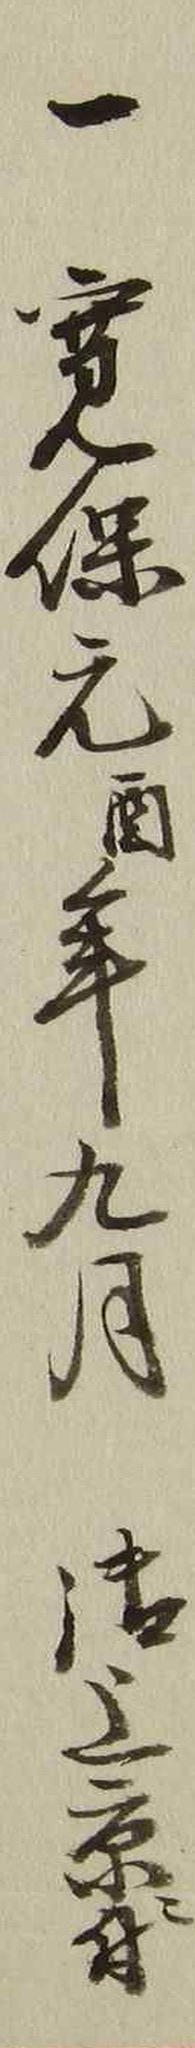一寛保元酉年九月御上京ニ付
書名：諸士系譜　巻之31　い之部31
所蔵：会津若松市立会津図書館
